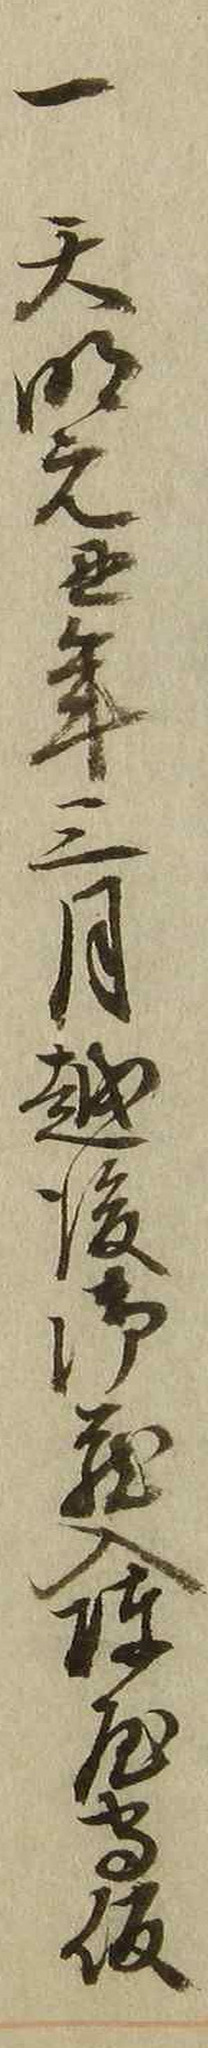一天明元丑年三月越後御蔵入陣屋守仮
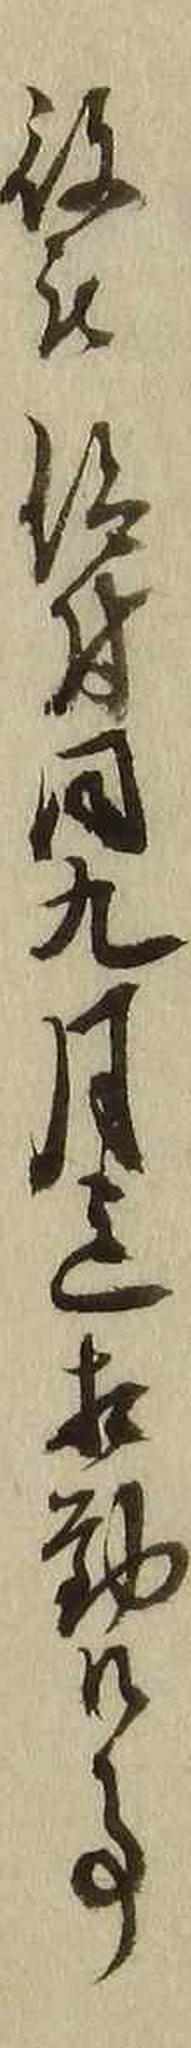役被仰付同九月迄相勤候事
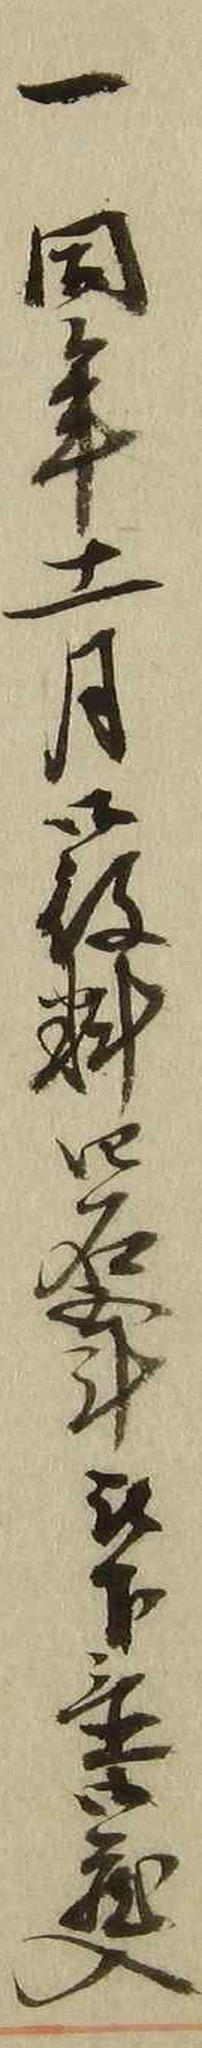一同年十一月御役料四石五斗被下置御蔵入
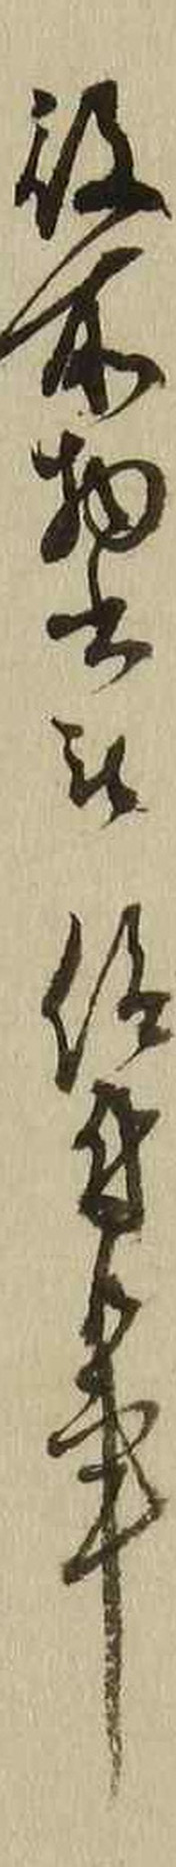役所物書被仰付候事
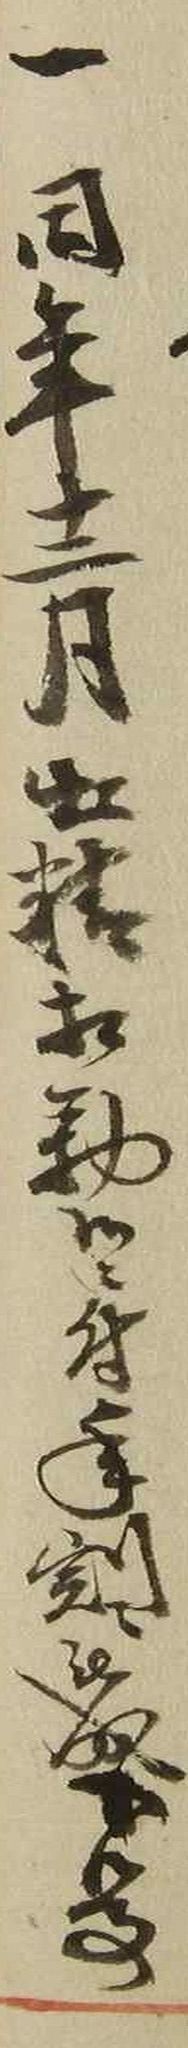一同年十二月出精相勤候に付年割に被成下候事
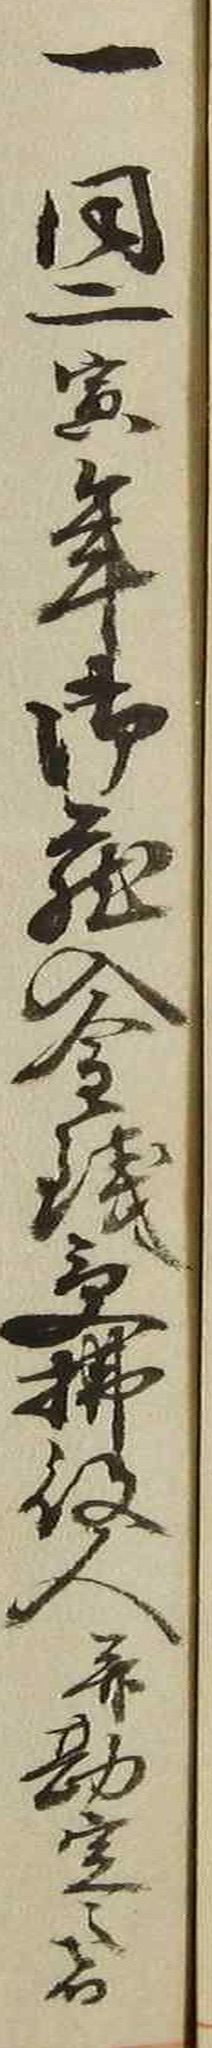一同二寅年御御蔵入金銭受払役人并勘定之者
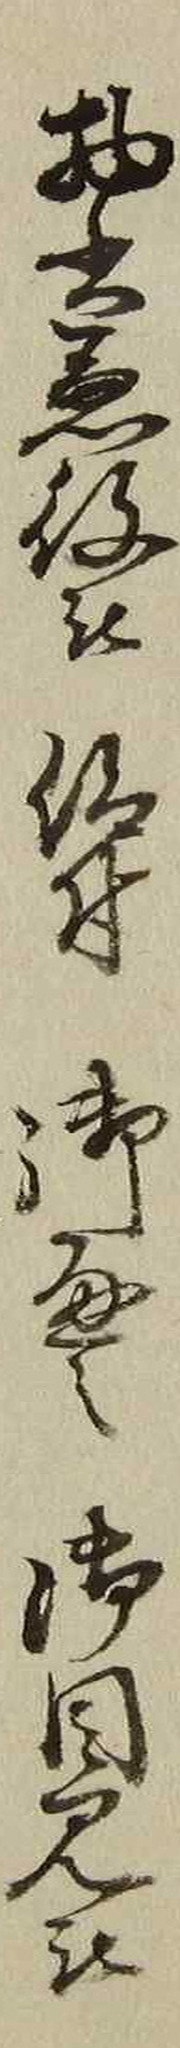物書兼役被仰付御通之御目見被
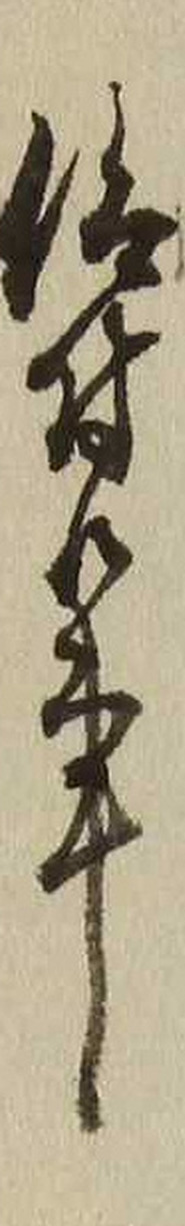仰付候事
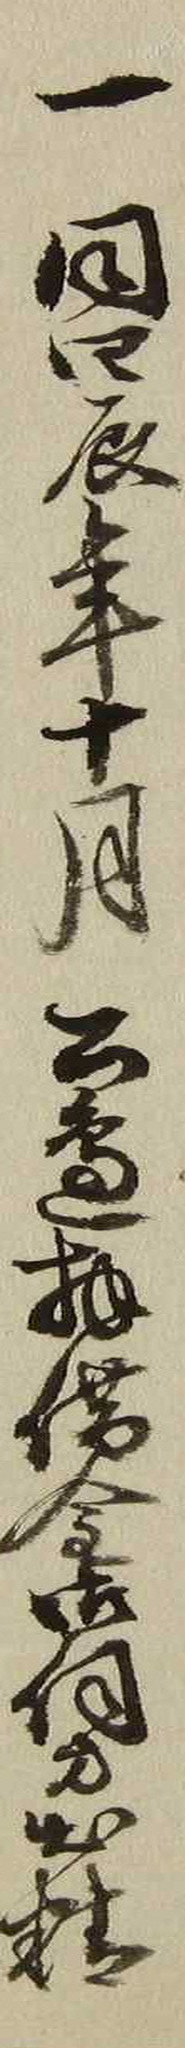一同四辰年十月公辺拝借金御伺方出精
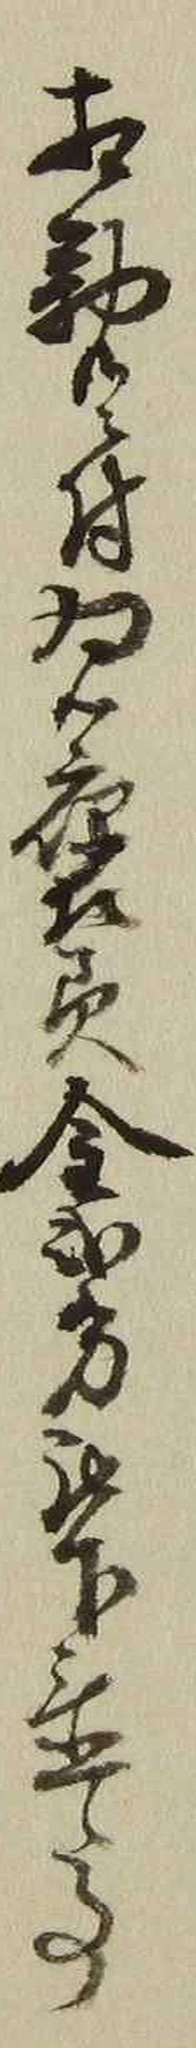相勤候に付為御褒美金弐分被下置候事
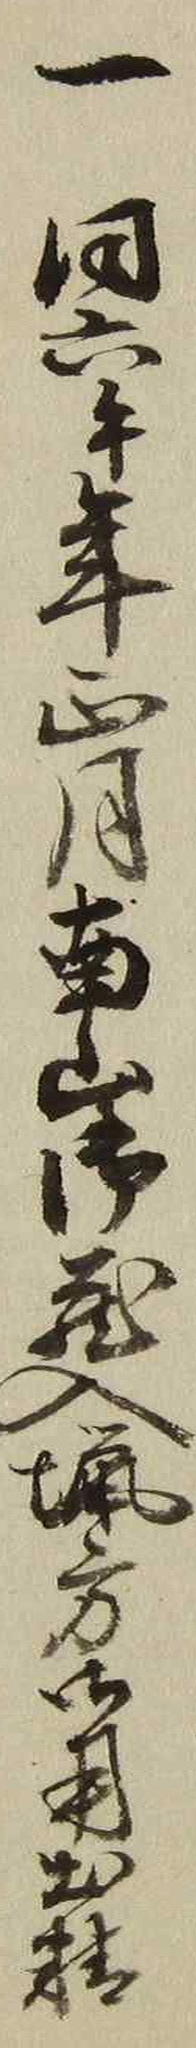一同六午年正月南山御蔵入猟方御用出精
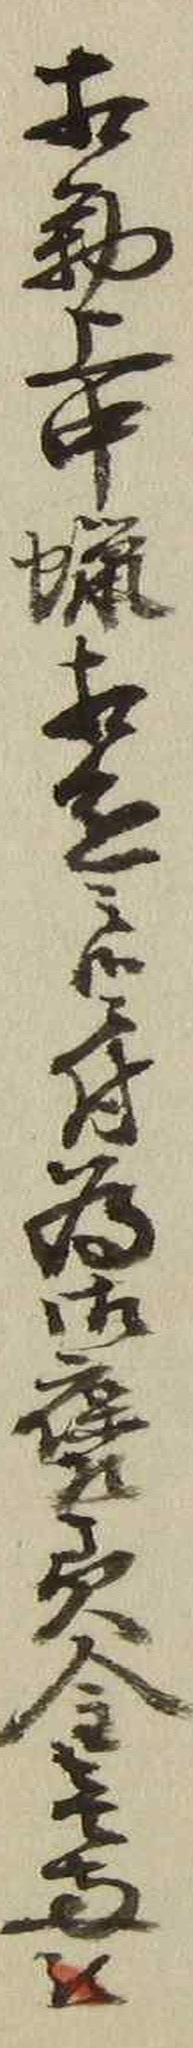相勤上中蝋相懸之候微付為褒美金壱両被
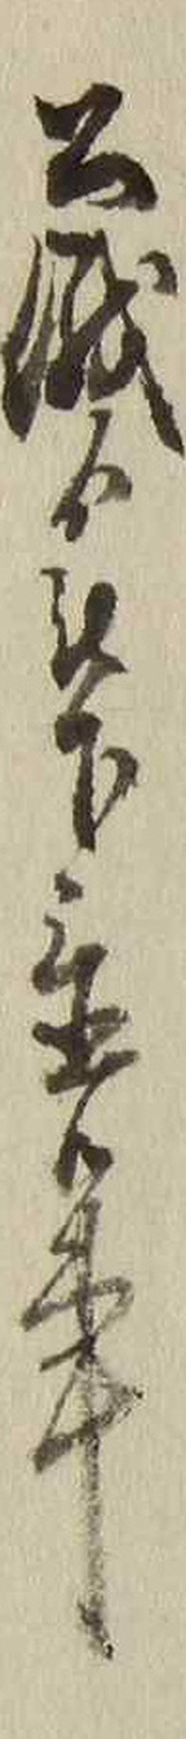公儀ゟ被下置候事
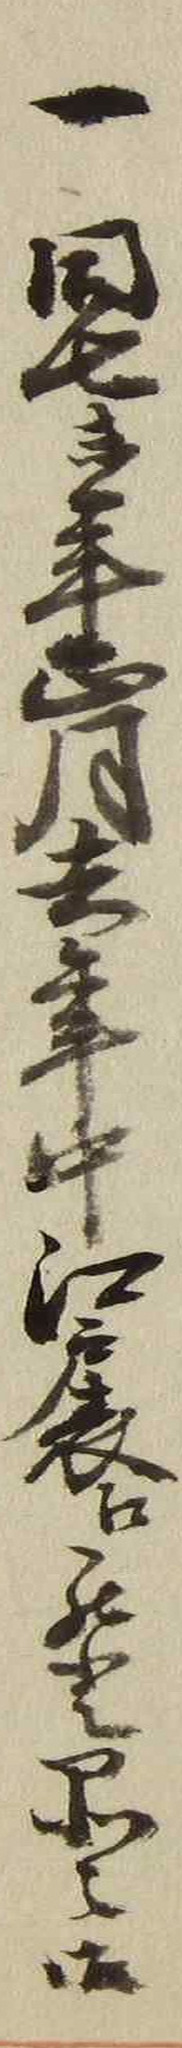一同七未年正月去年中江戸表え可罷登品之御
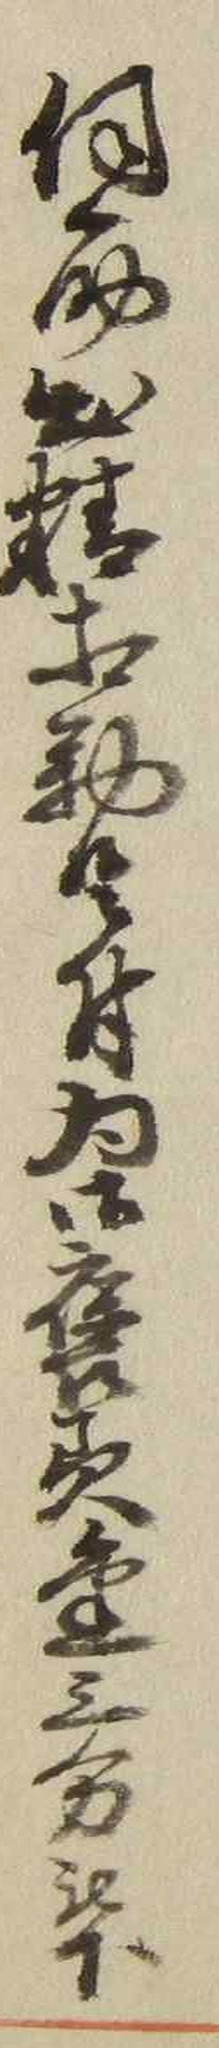伺筋出精相勤候に付為御褒美金三分被下

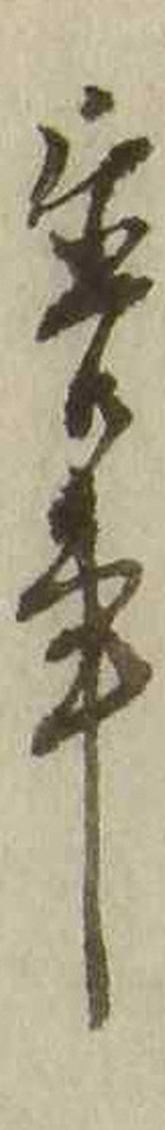置候事
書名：諸士系譜　巻之38　は之部6
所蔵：会津若松市立会津図書館
